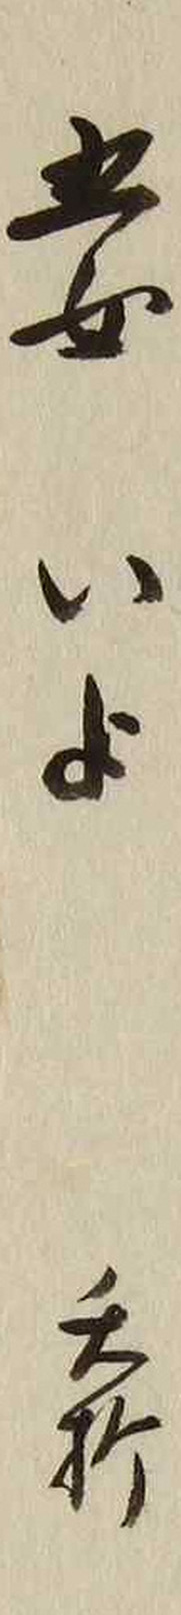五女いよ夭折
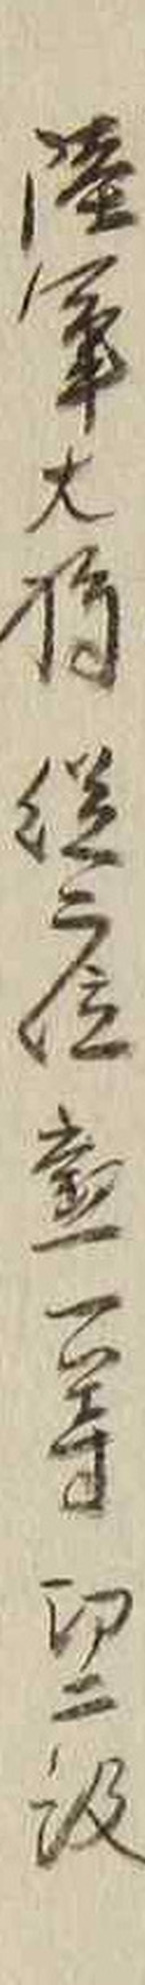陸軍大将従二位勲一等功二級
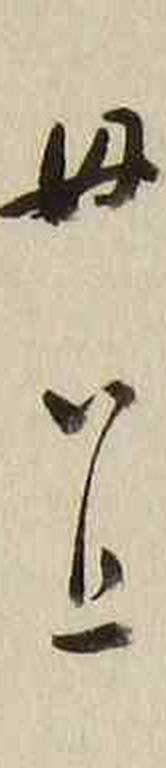母同上
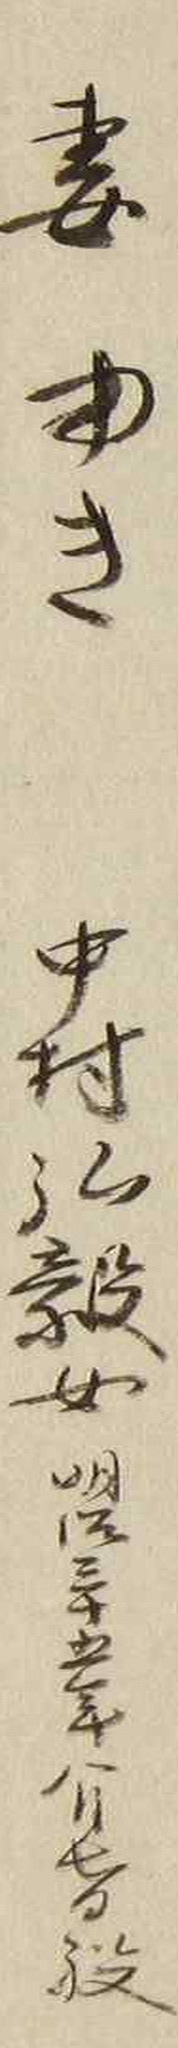妻ゆき中村弘毅女明治三十五年八月七日歿
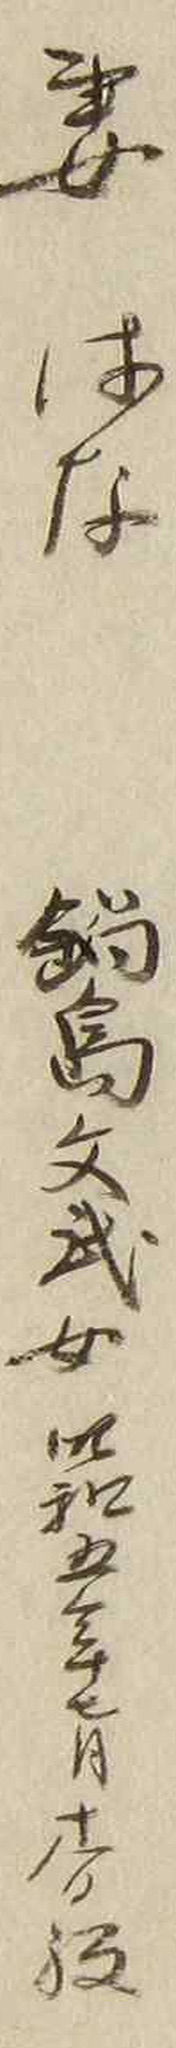妻はな鍋島文武女昭和五年七月十八日歿

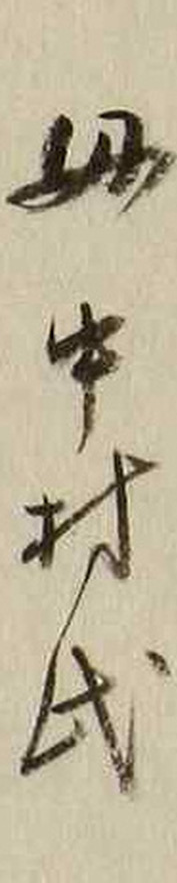母中村氏
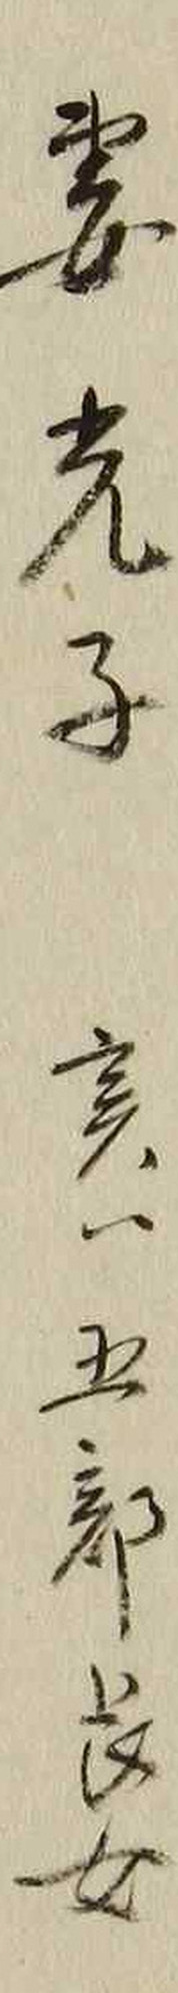妻光子実ハ五郎長女
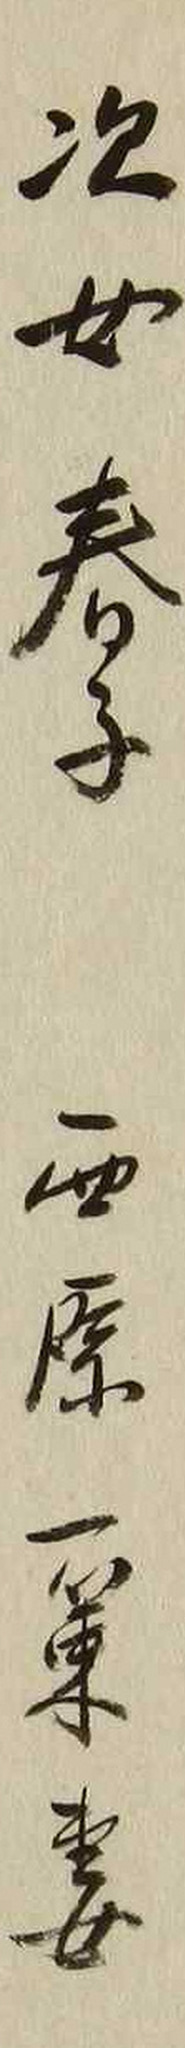次女春子西原一策妻
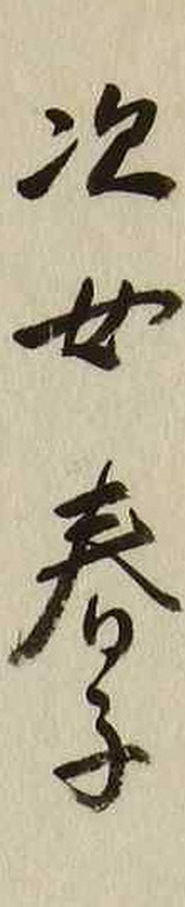次女康子
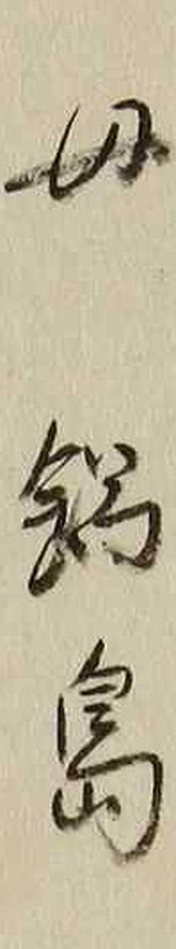母鍋島
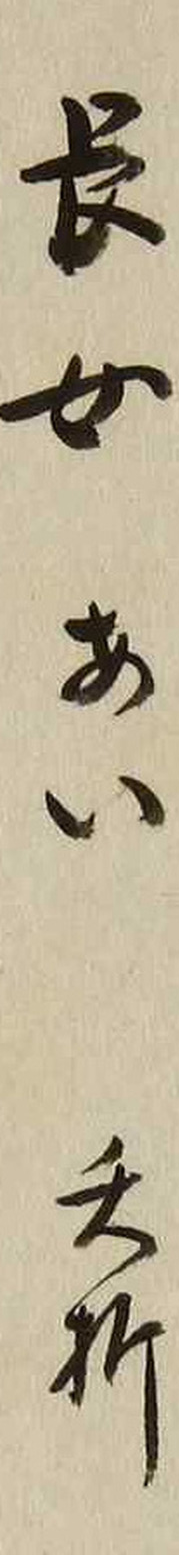長女あい夭折
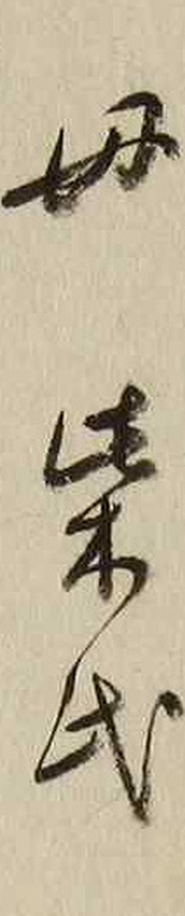母柴氏
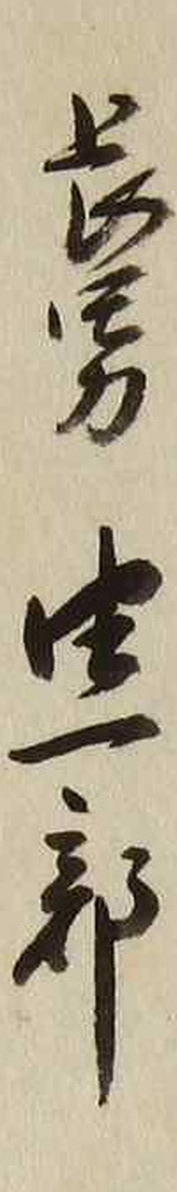長男由一郎
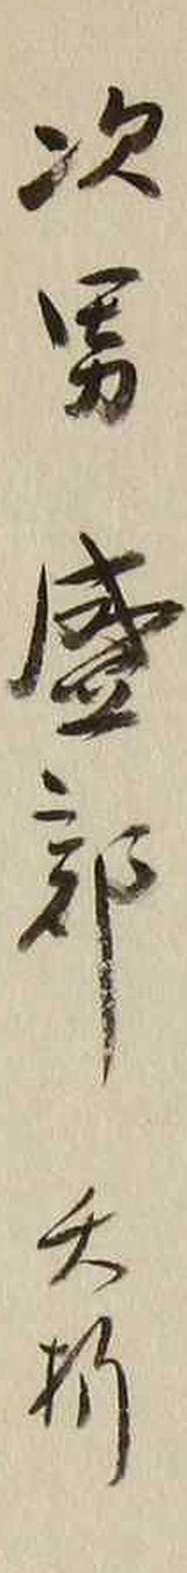次男盛郎夭折
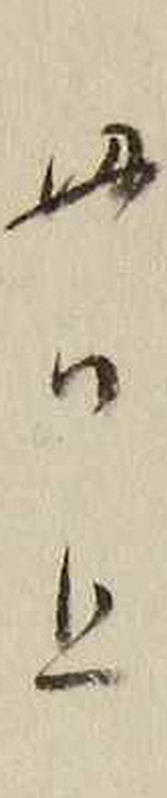母同上
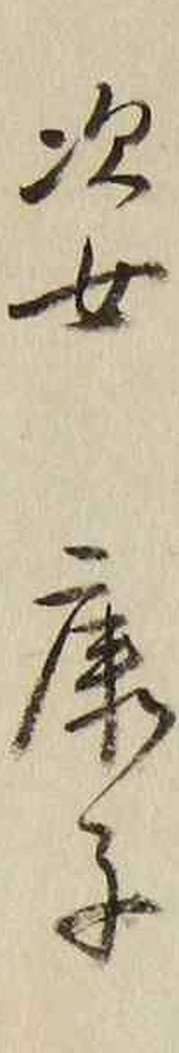次女康子
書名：諸士系譜　巻之311　し之部1
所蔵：会津若松市立会津図書館
